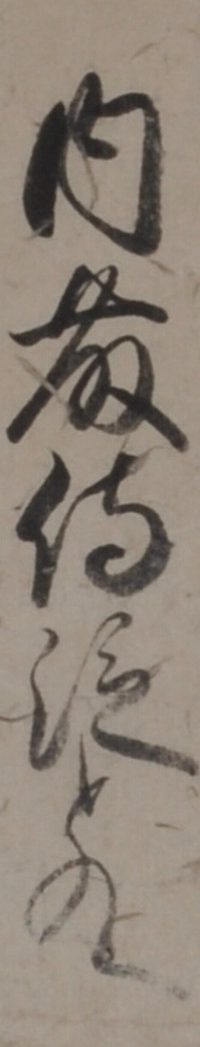内藤侍従とのへ

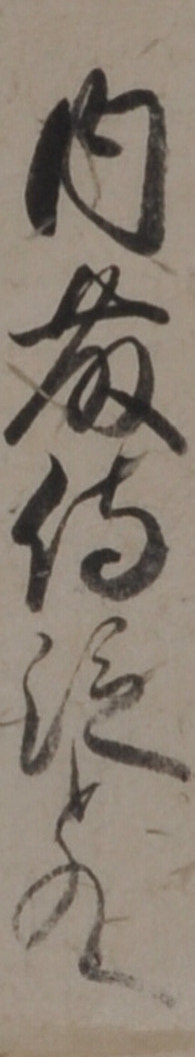内藤侍従とのへ

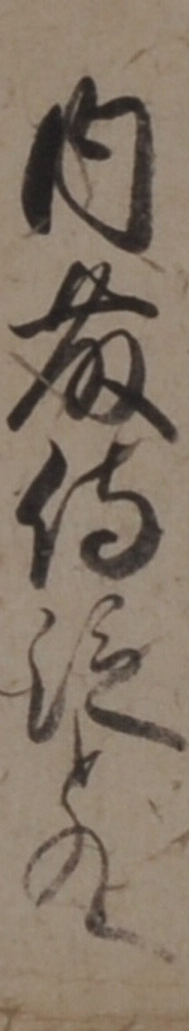内藤侍従とのへ
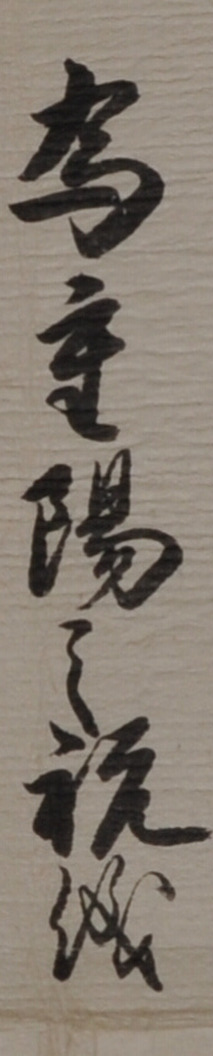為重陽之祝儀
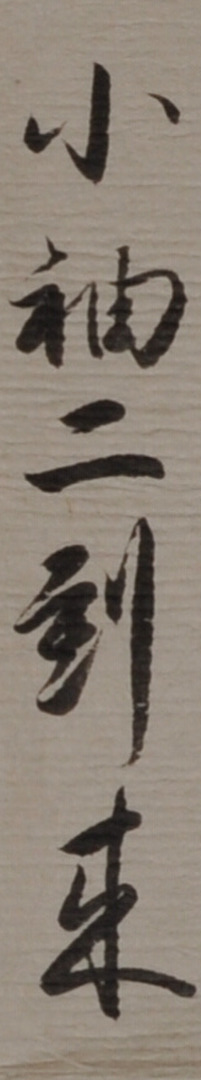小袖二到来
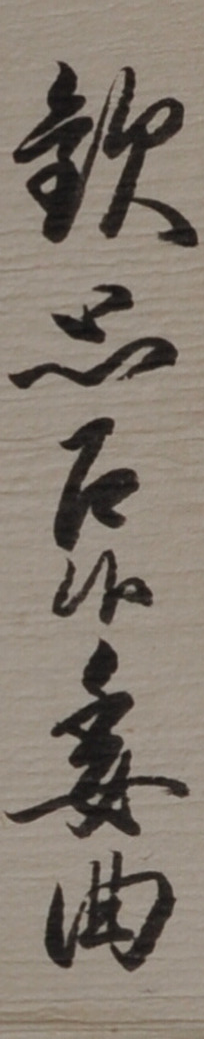歓思召候委曲
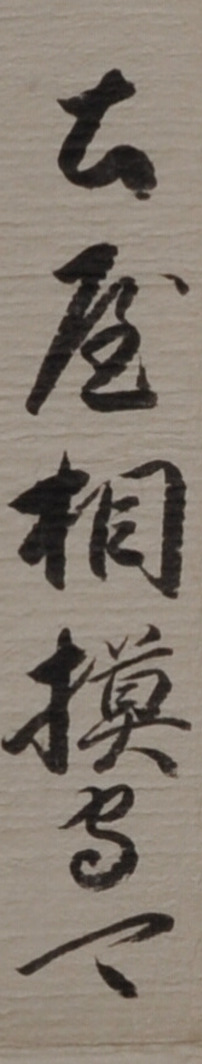土屋相模守可
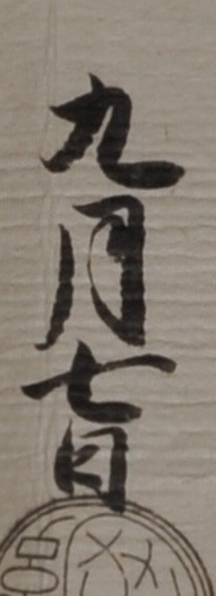九月七日
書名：御内書
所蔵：伊那市立高遠町図書館・合同会社AMANE
